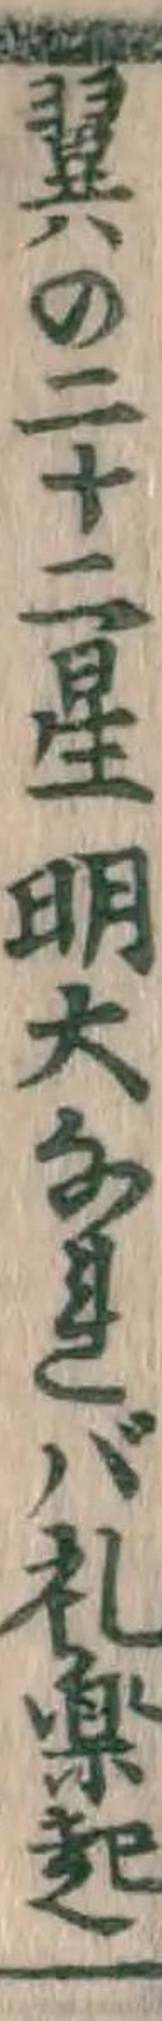翼の二十二星明大なれば礼楽起
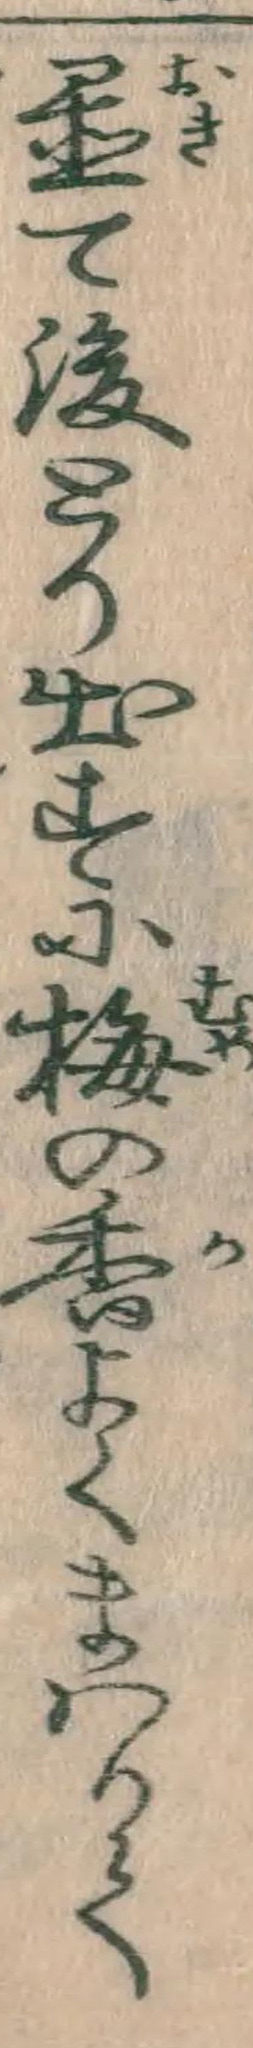置て後とり出すに梅の香よくまはりて
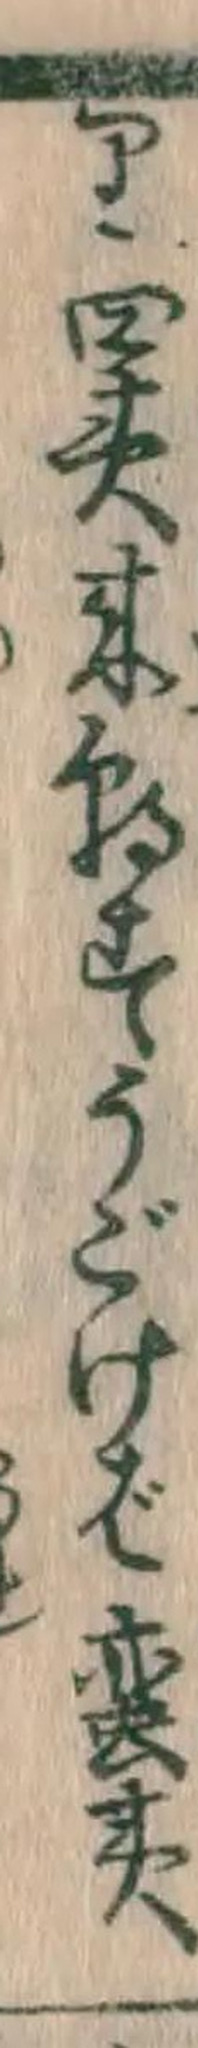り四夷来朝すうごけば蛮夷
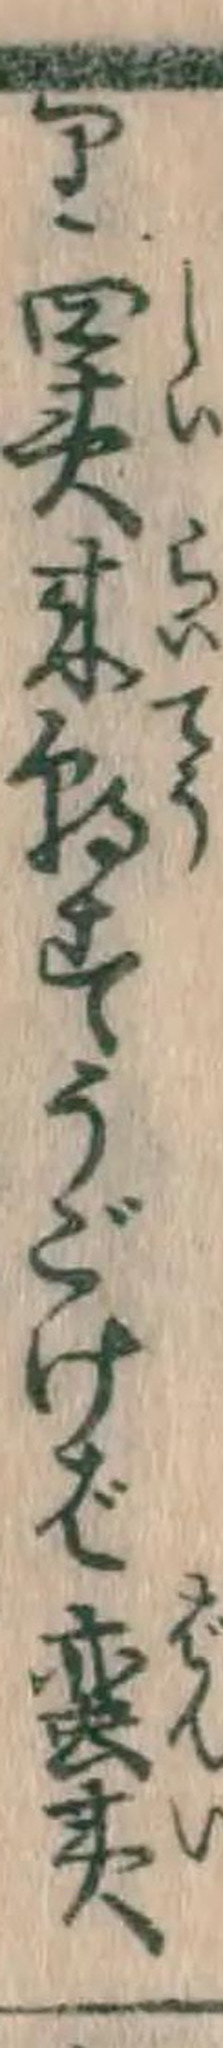り四夷来朝すうごけば蛮夷
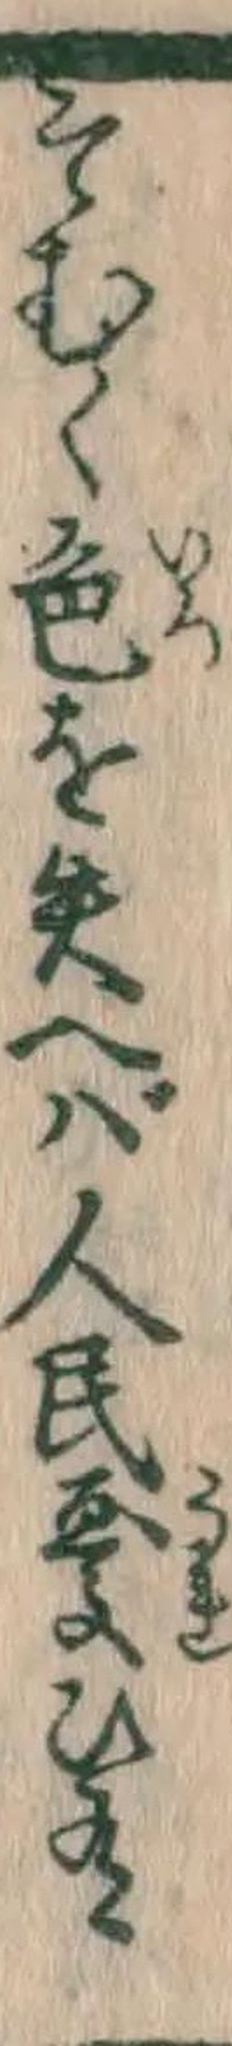そむく色を失へば人民憂ひ有
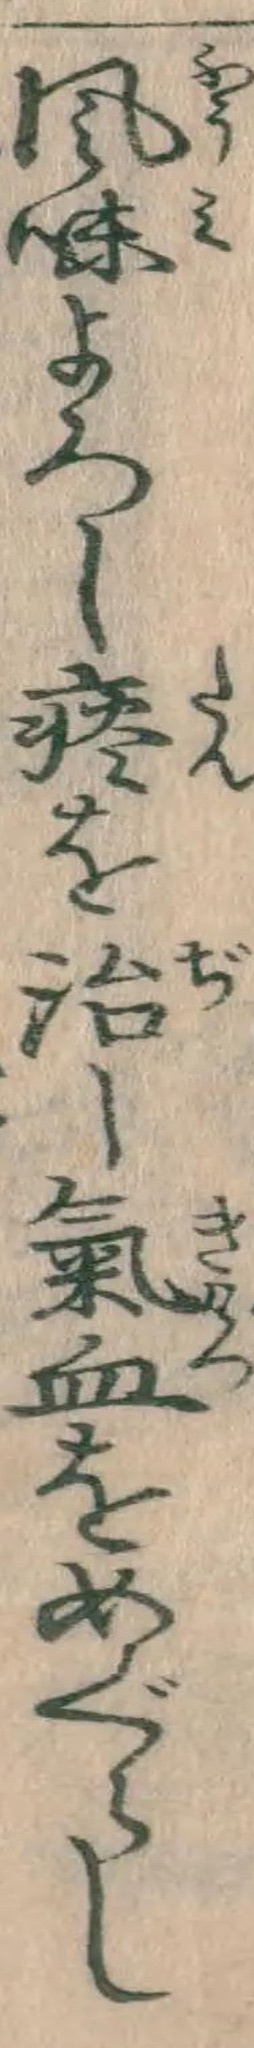風味よろし痰を治し気血をめぐらし
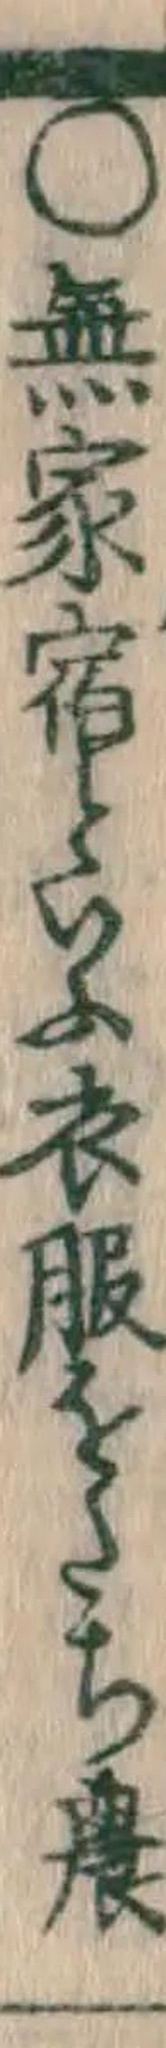○無家宿といふ衣類をたち農
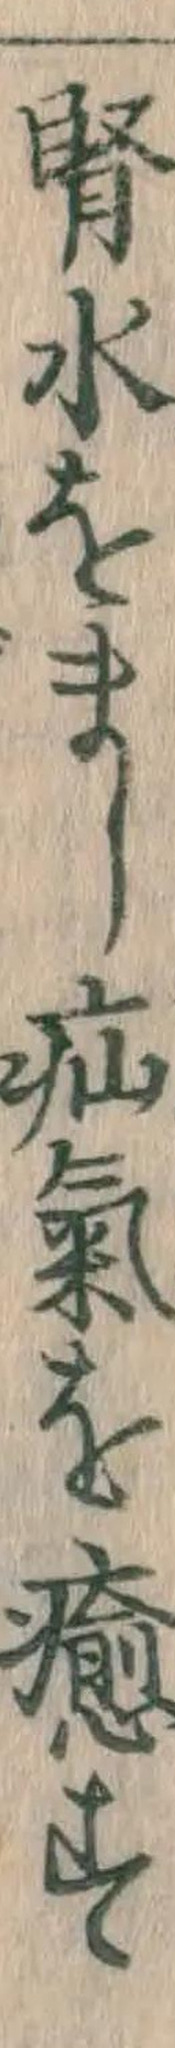腎水をまし疝気を癒す
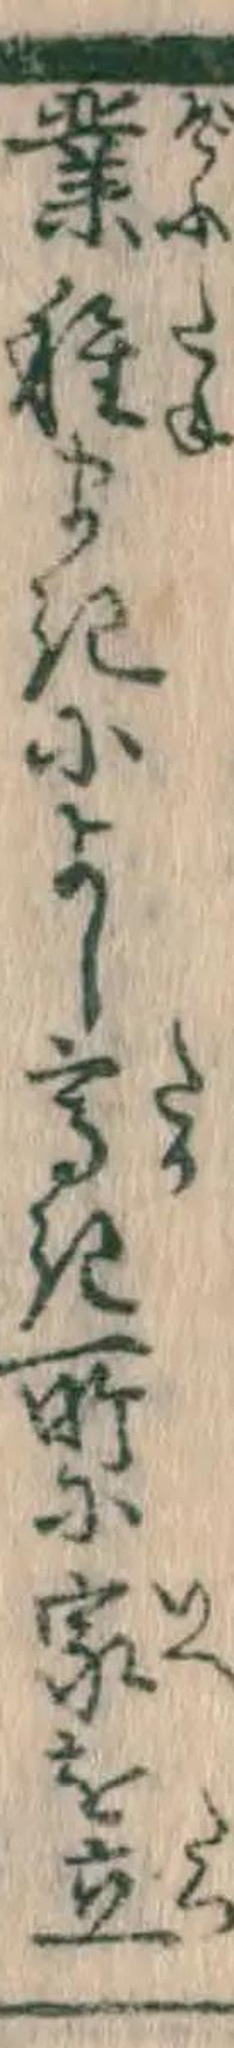業種まきによし高き所に家を立
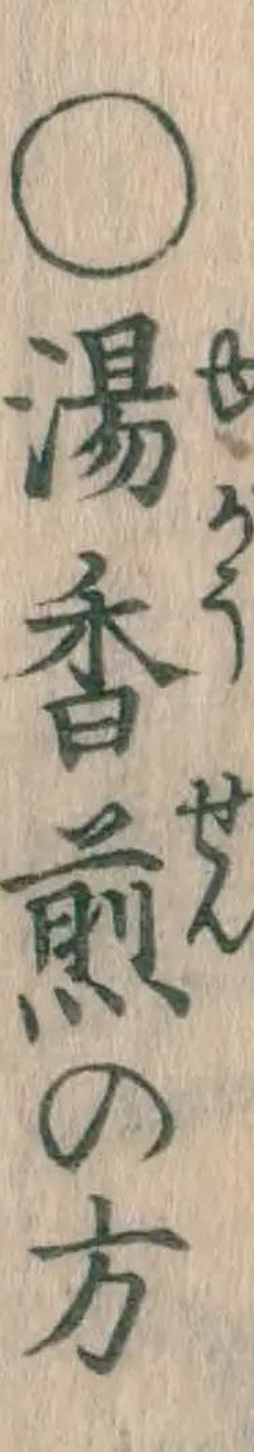○湯香煎の方
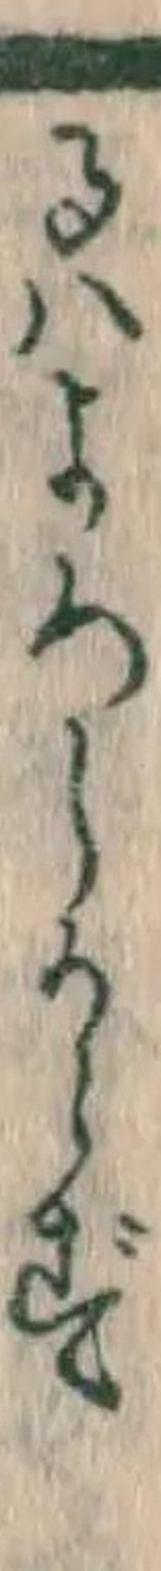るはよろしからず
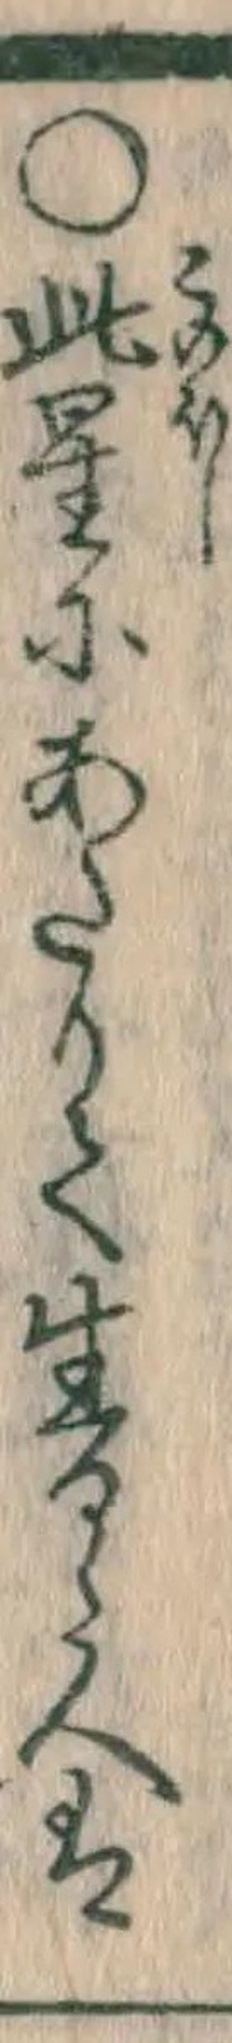○此星にあたりて生るゝ人は
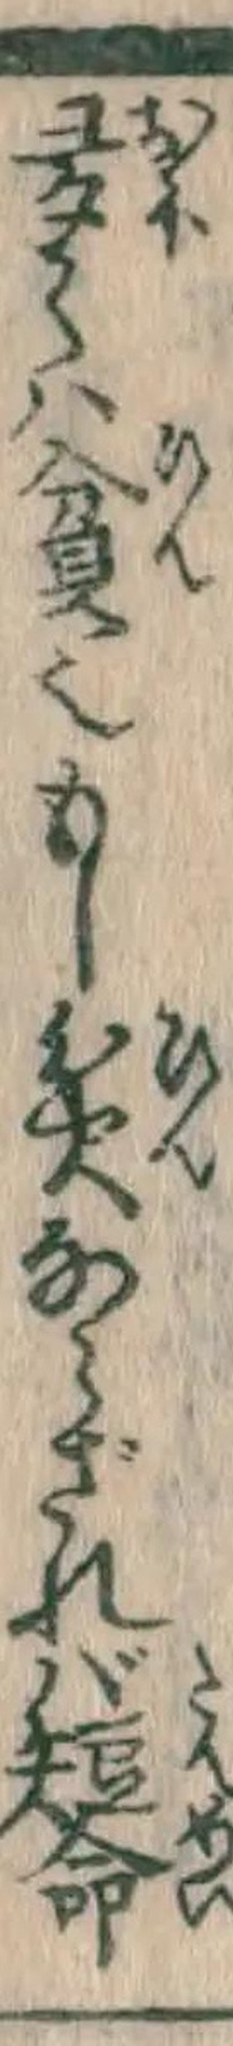多くは貧也もし貧ならざれば短命
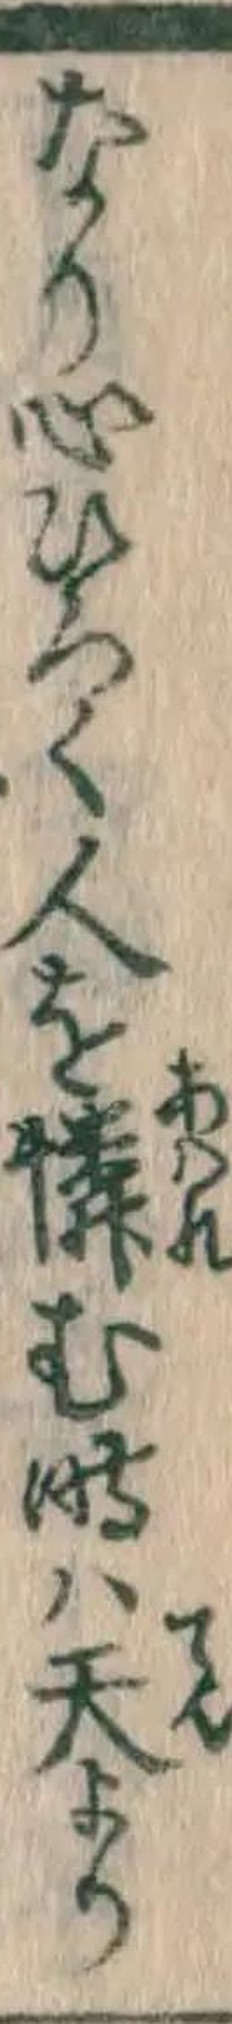なり心ひろく人を憐む時は天より
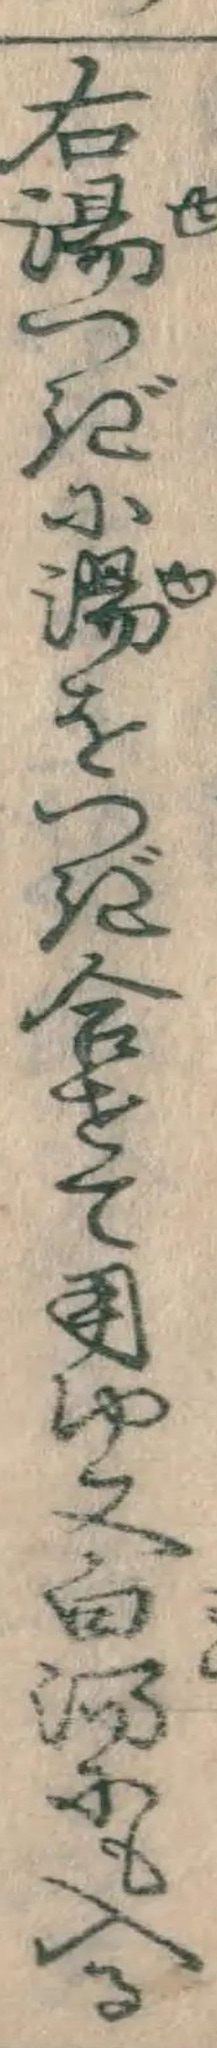右湯つぎに湯をつぎ合せて用ゆ又白湯にも入る
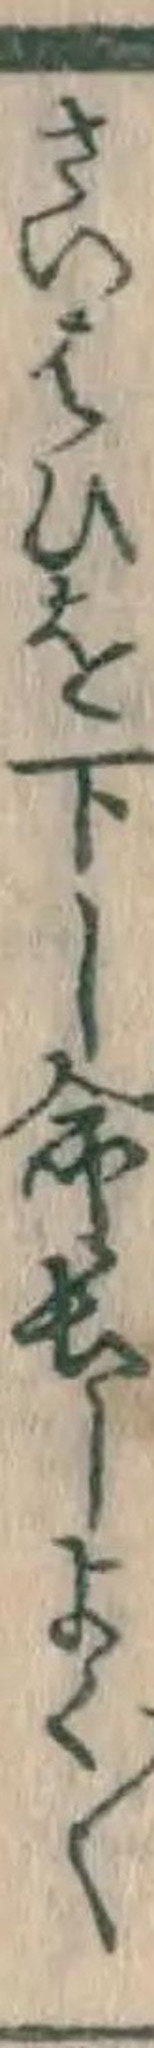さいはひを下し命長しよく〳〵
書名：広益秘事大全 3巻. [2]
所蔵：国立国会図書館 National Diet Library, JAPAN
